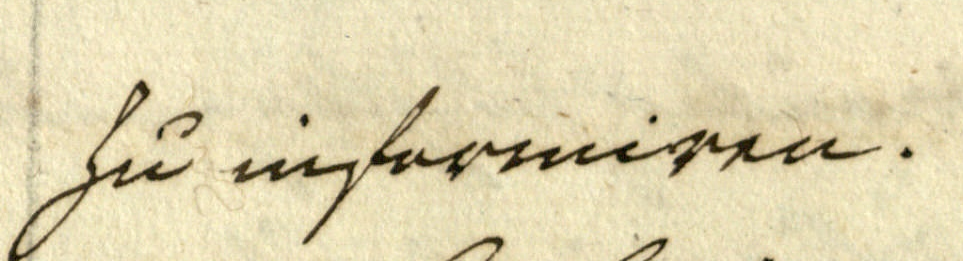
zu informiren.
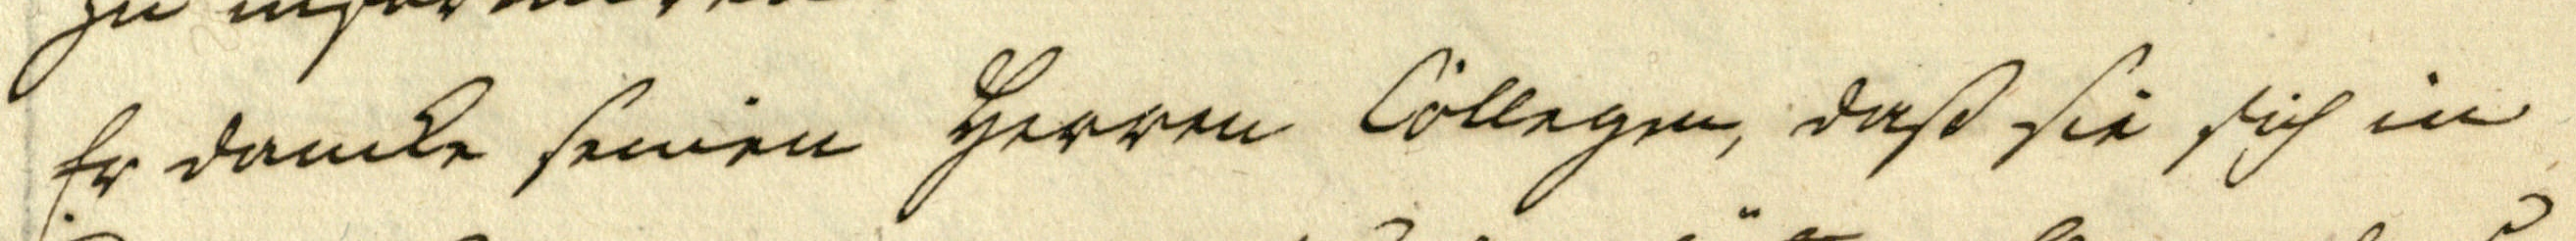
Er dancke seinen Herren Collegen, daß sie sich in
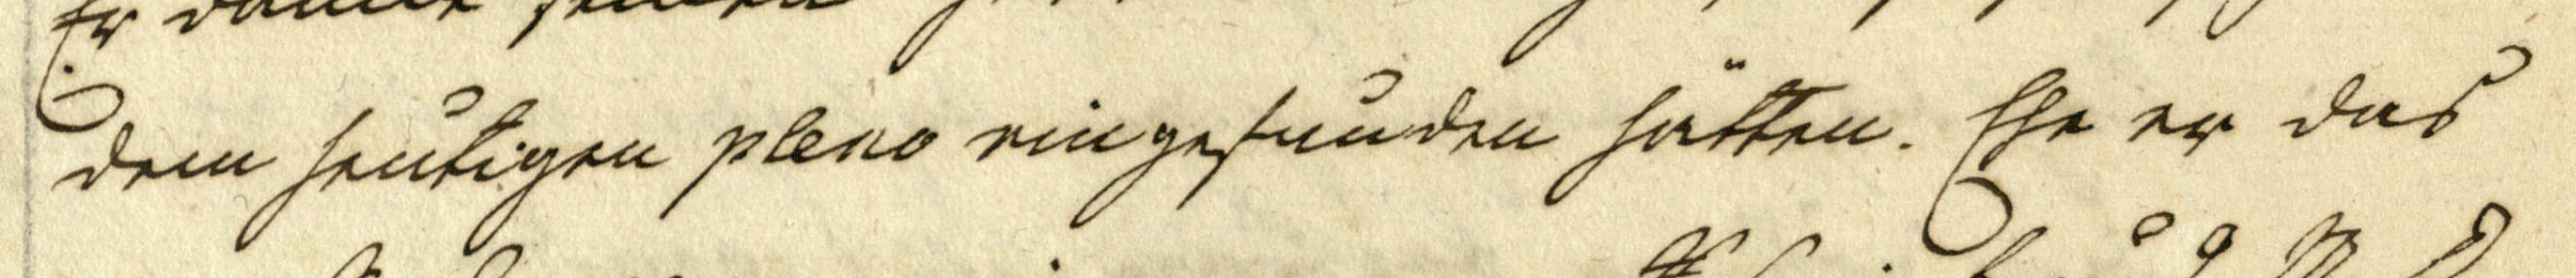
dem heutigen pleno eingefunden hätten. Ehe er das
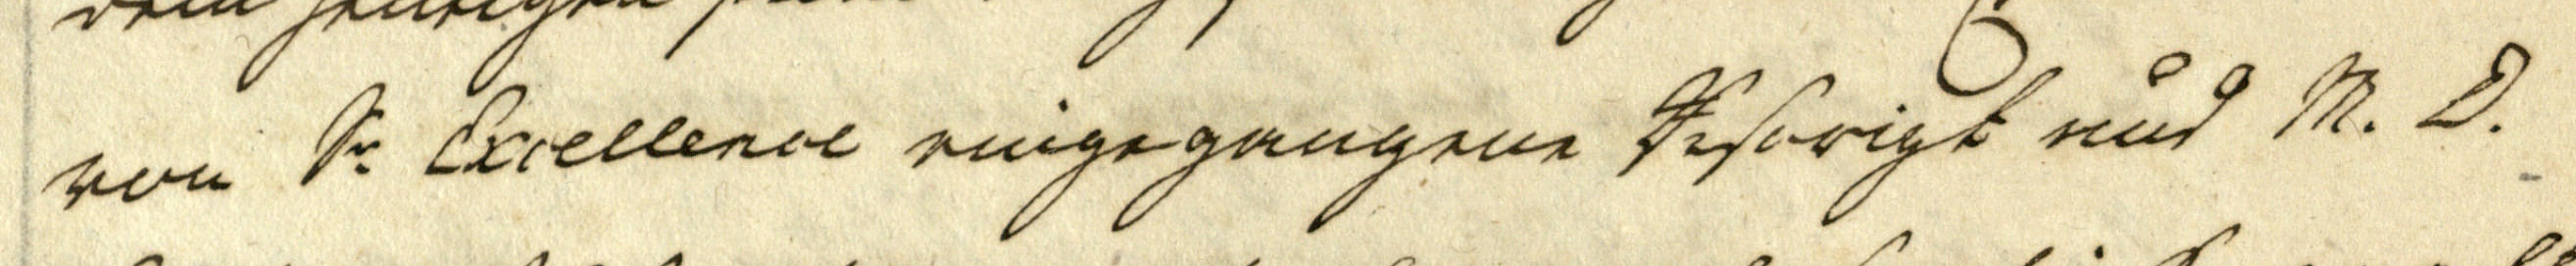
von Sr. Excellence eingegangene Resript und M. D.
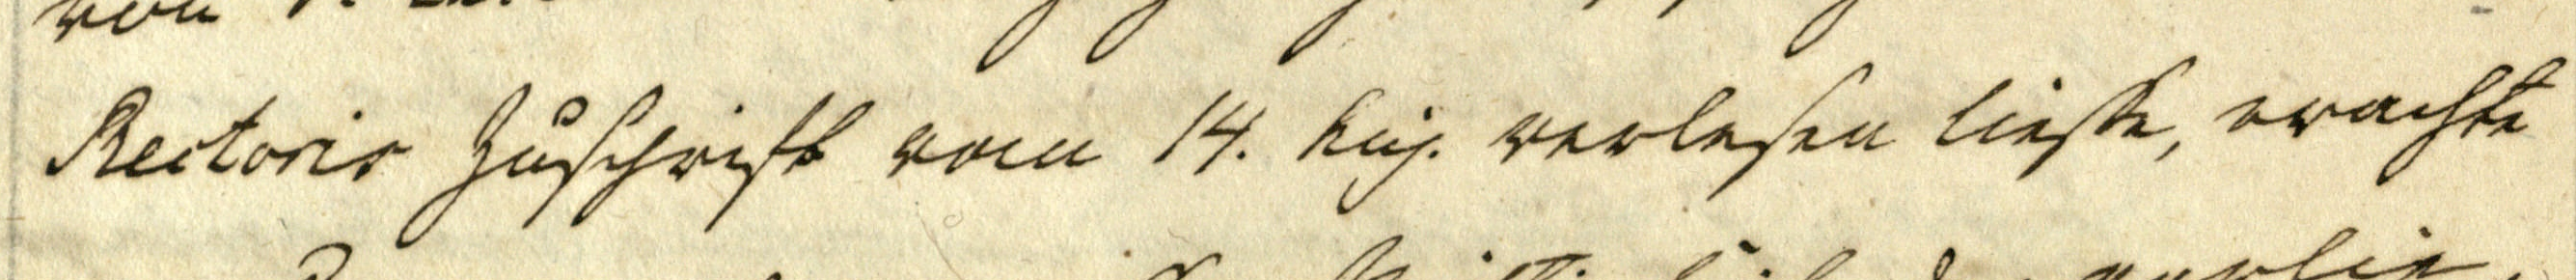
Rectoris Zuschrift vom 14. huj. verlesen liesse, erachte
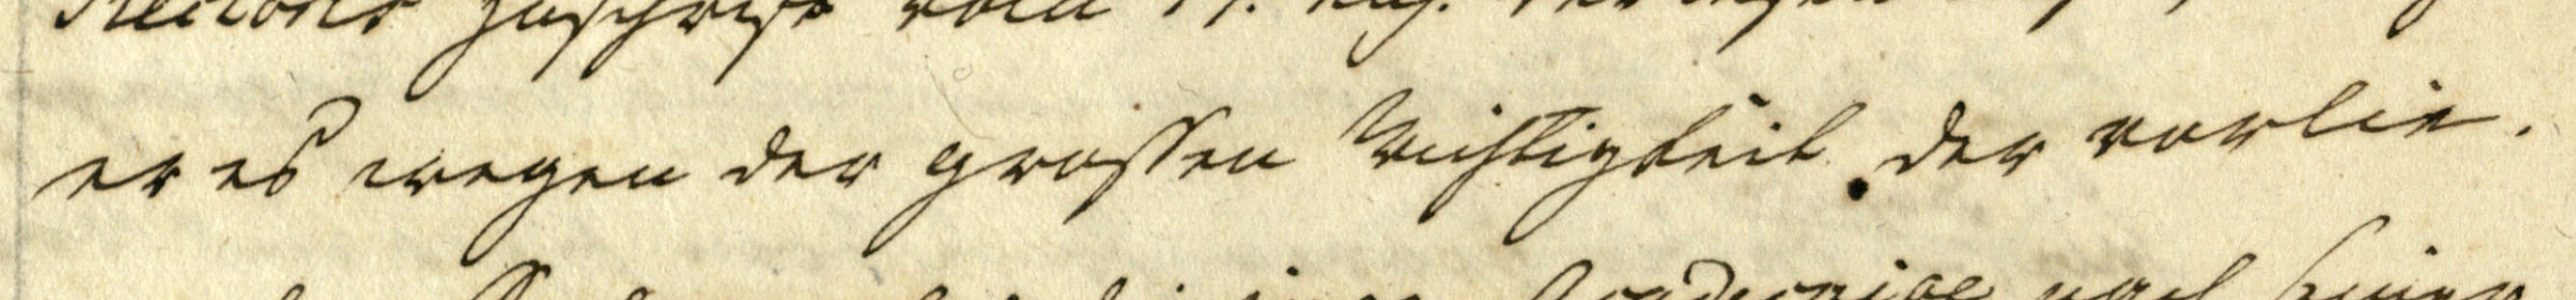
er es wegen der grossen Wichtigkeit, der vorlie¬
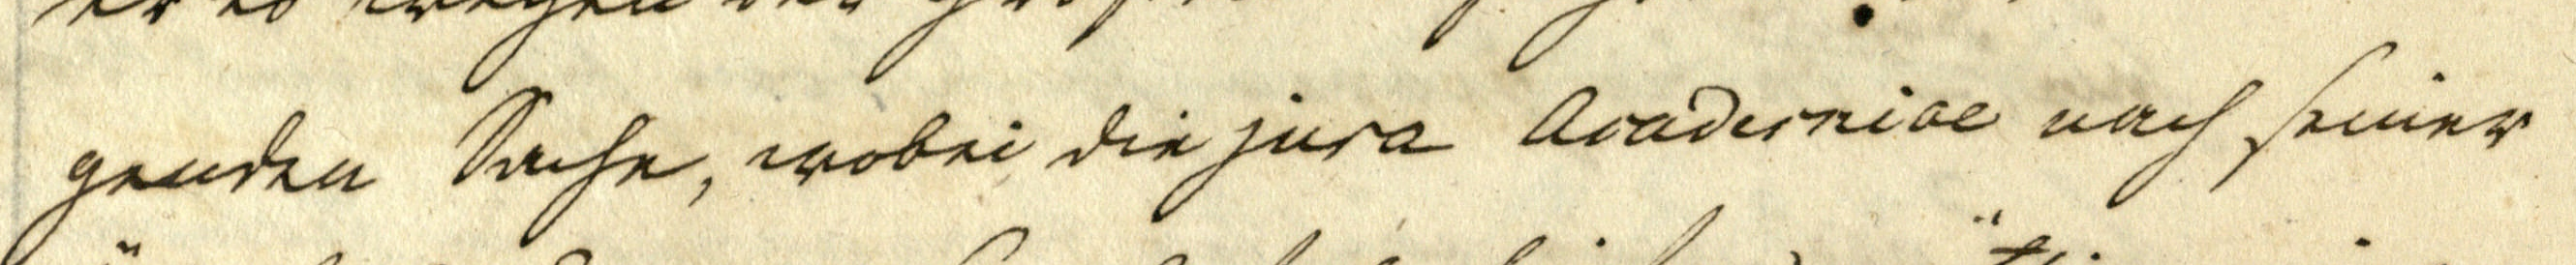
genden Sache, wobei die jura Academiae nach seiner
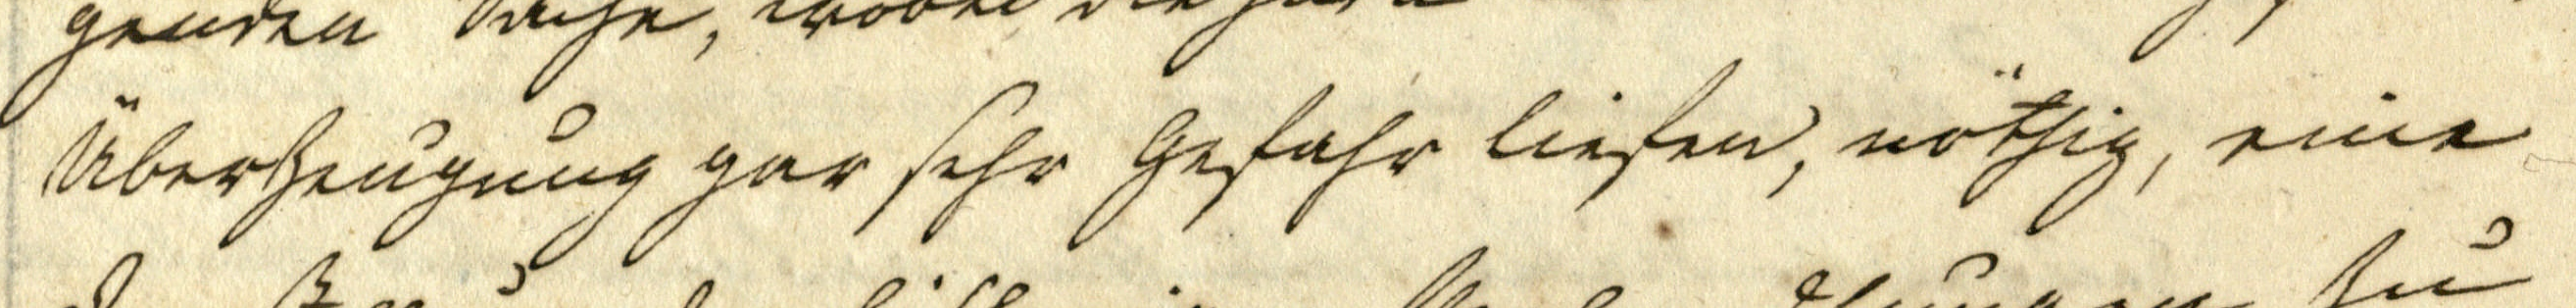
Überzeugung gar sehr Gefahr liefen, nöthig, eine
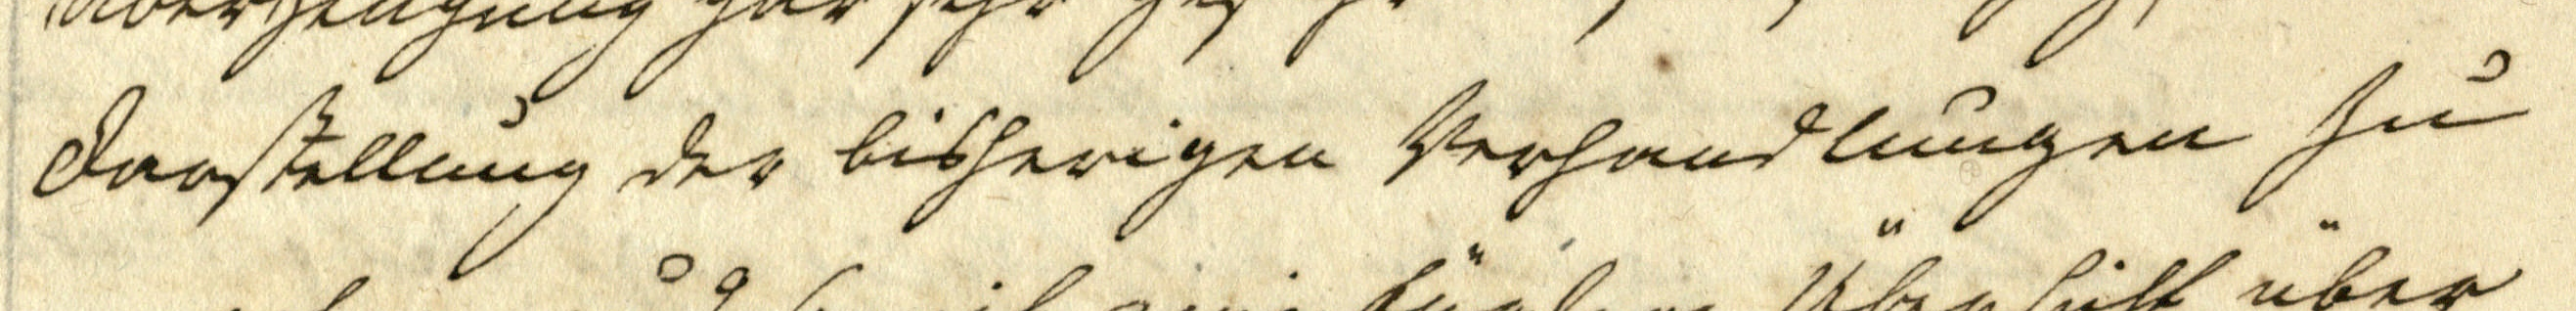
Darstellung der bisherigen Verhandlungen zu
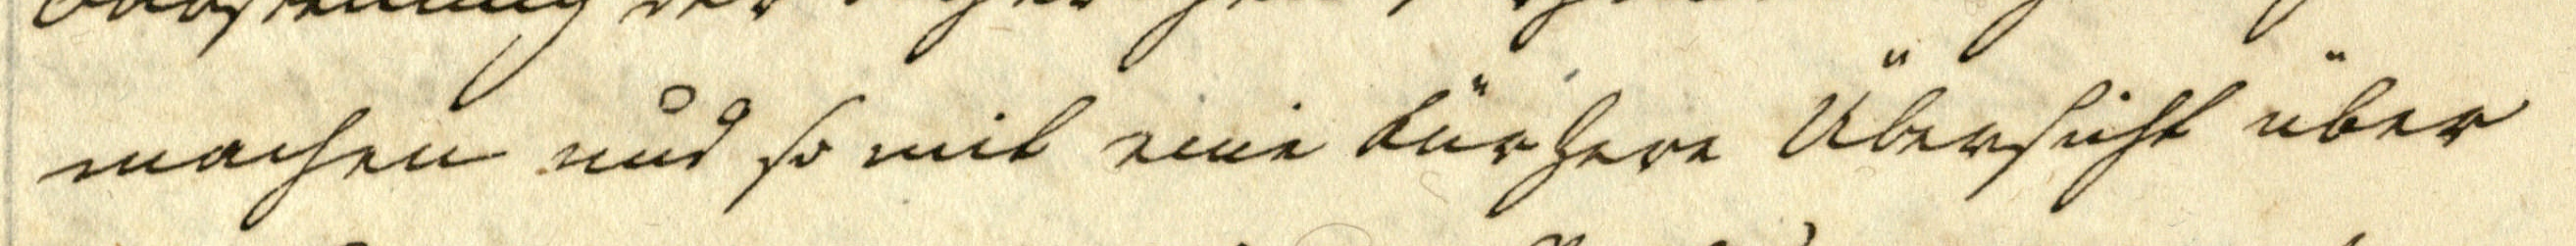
machen und so mit eine kürzere Übersicht über
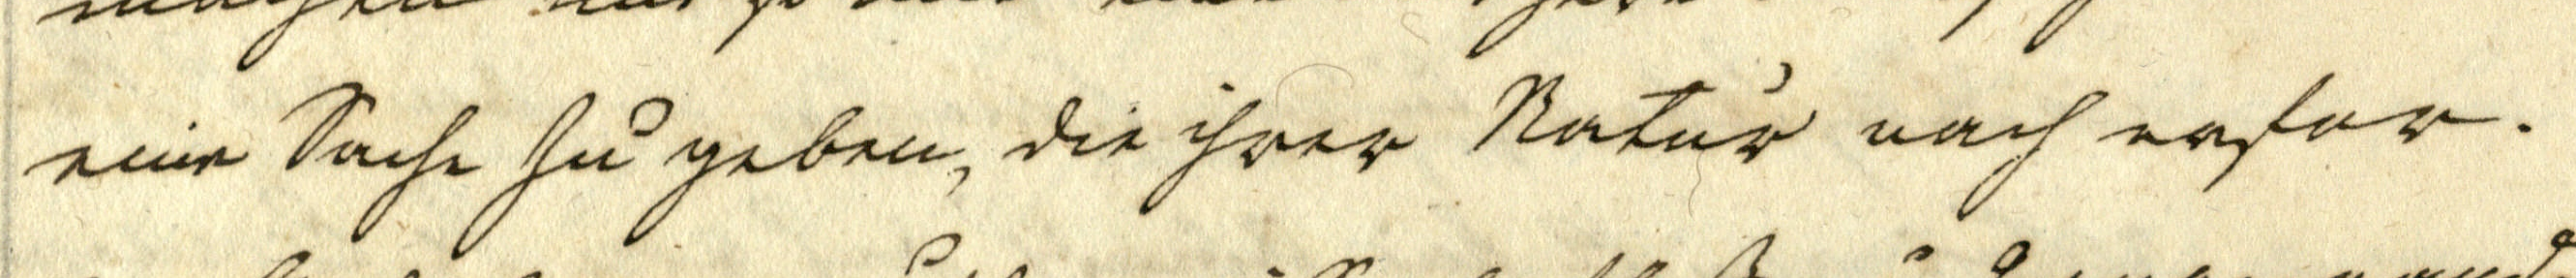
eine Sache zu geben, die ihrer Natur nach erfor¬
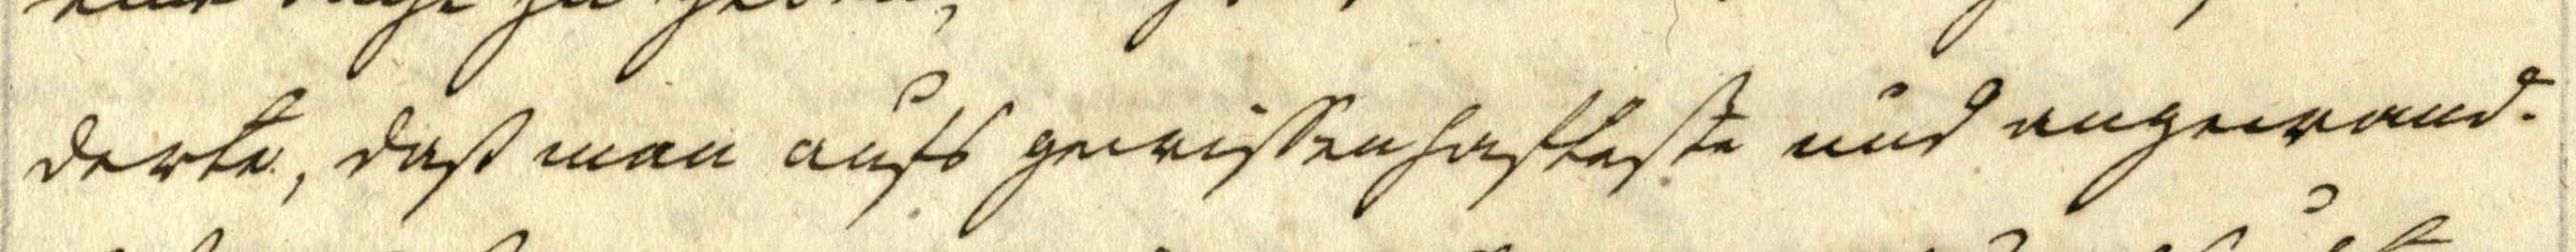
derte, daß man aufs gewissenhafteste und angewand¬
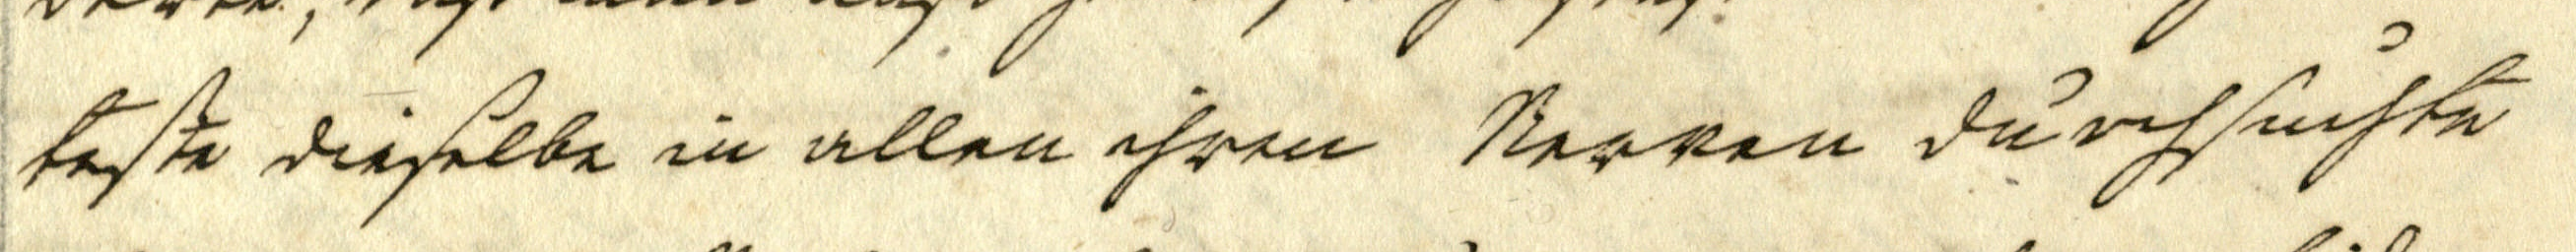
teste dieselbe in allen ihren Nerven durchsuchte
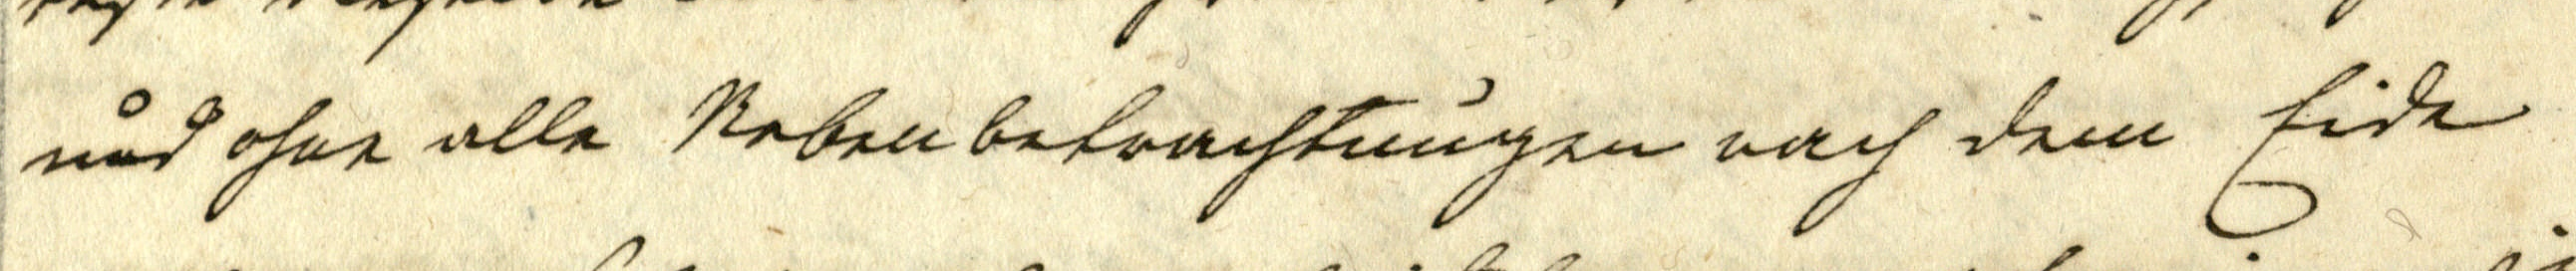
und ohne alle Nebenbetrachtungen nach dem Eide
